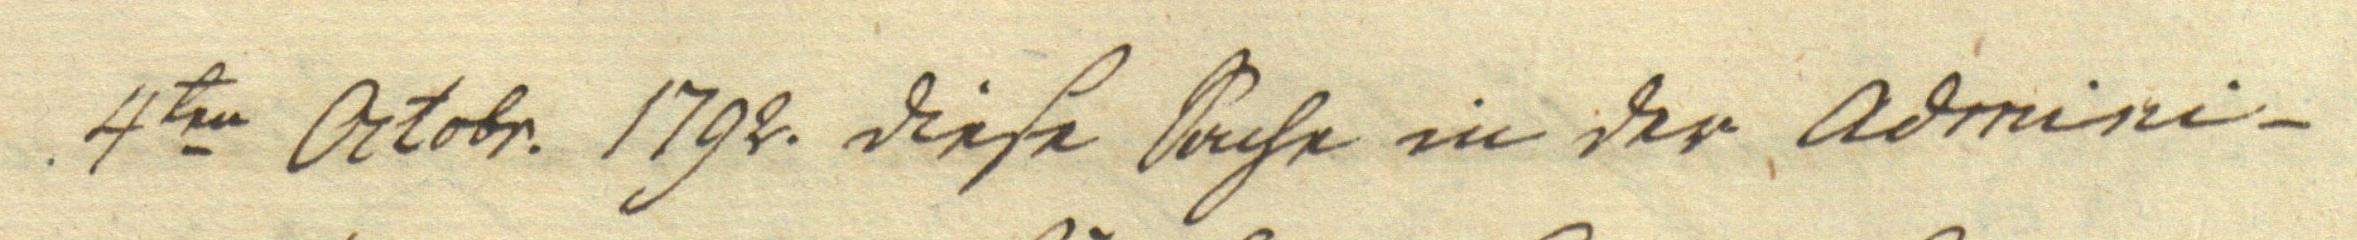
4 ten Octobr. 1792. diese Sache in der Admini¬
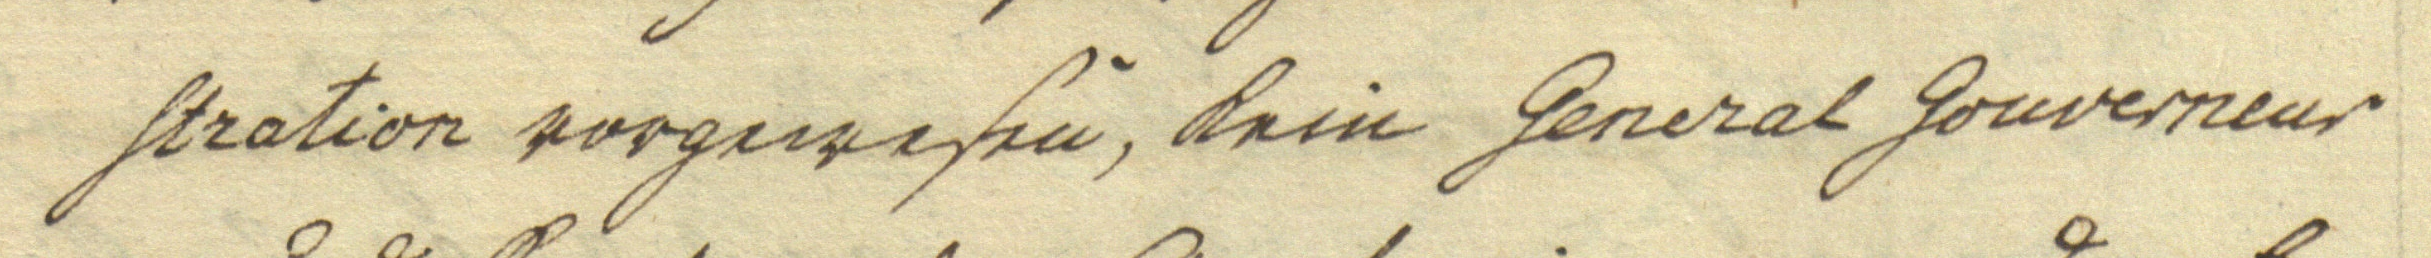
stration vorgewesen, kein General Gouverneur
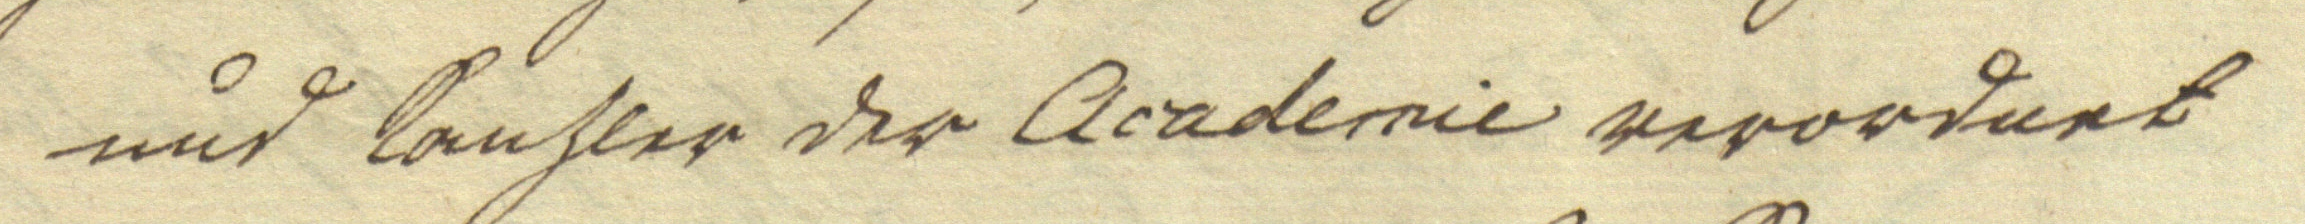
und Kanzler der Academie verordnet
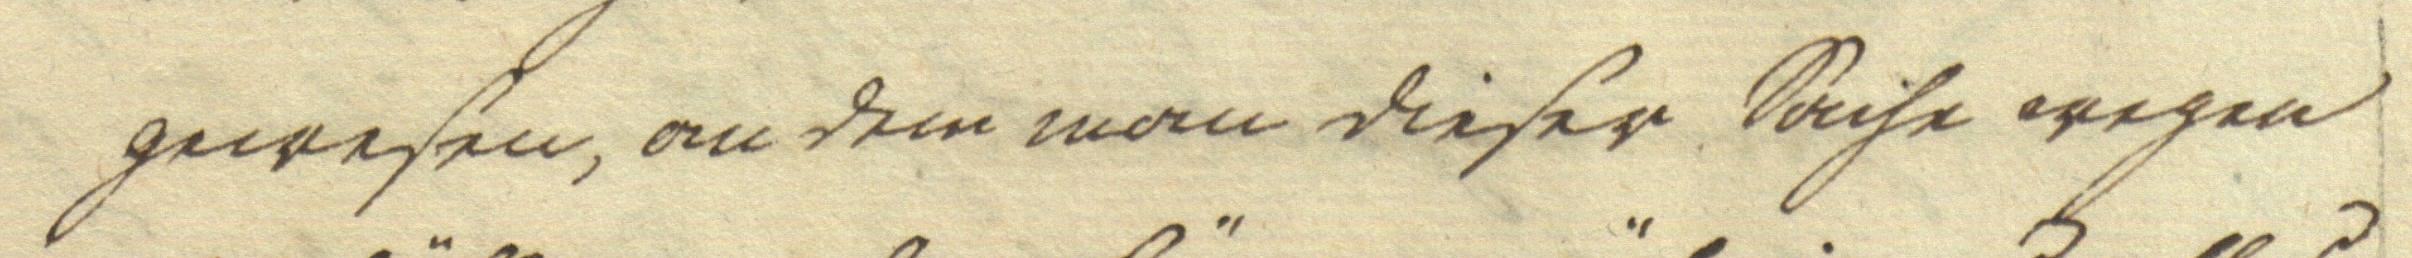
gewesen, an dem man dieser Sache wegen
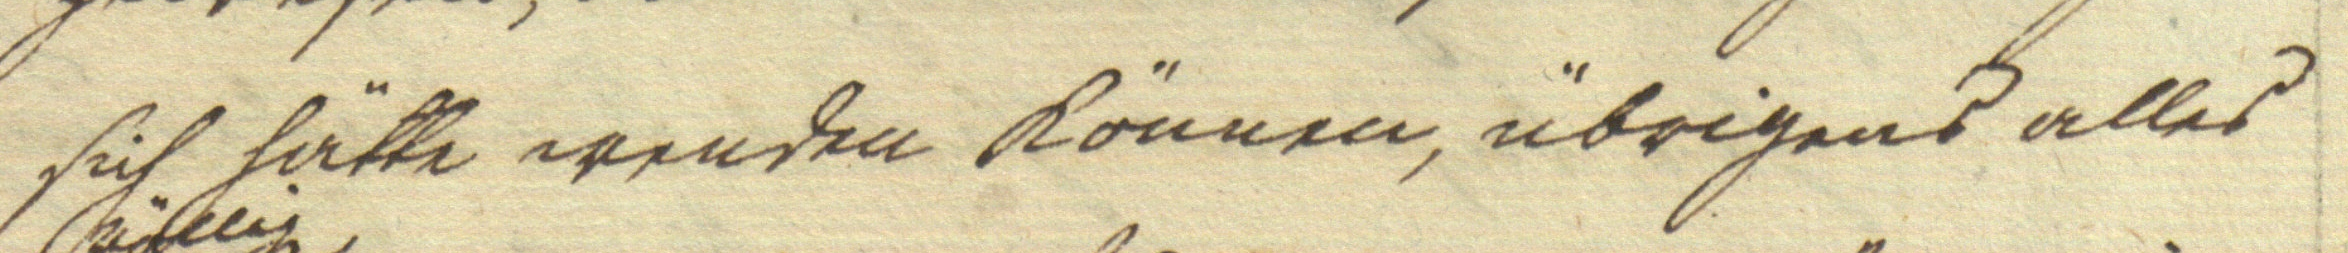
sich hätte wenden können, übrigens alles
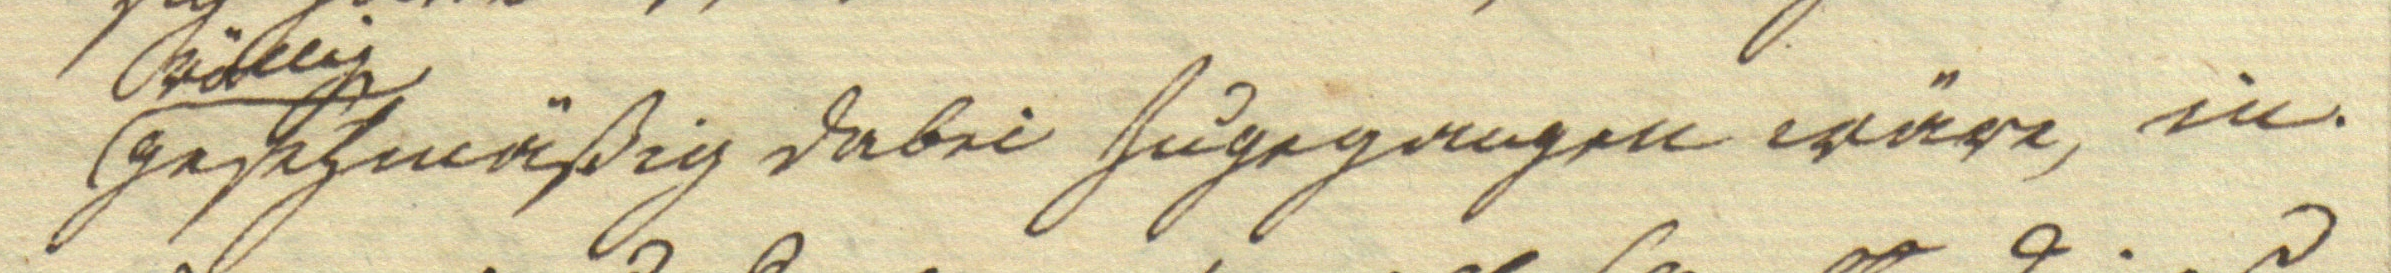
völlig gesetzmäßig dabei zugegangen wäre, in¬
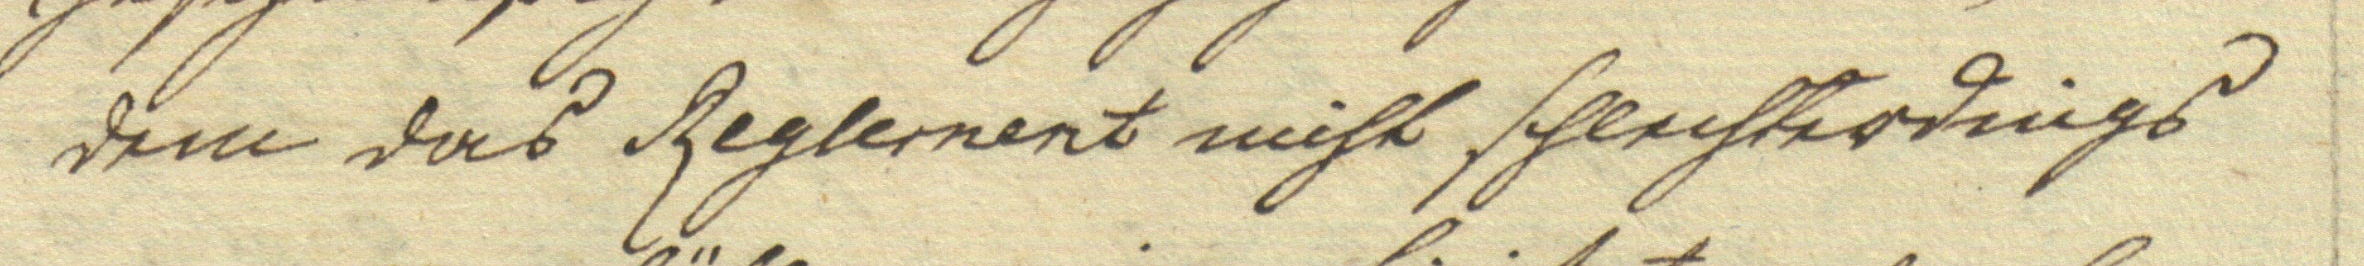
dem das Reglement nicht schlechterdings
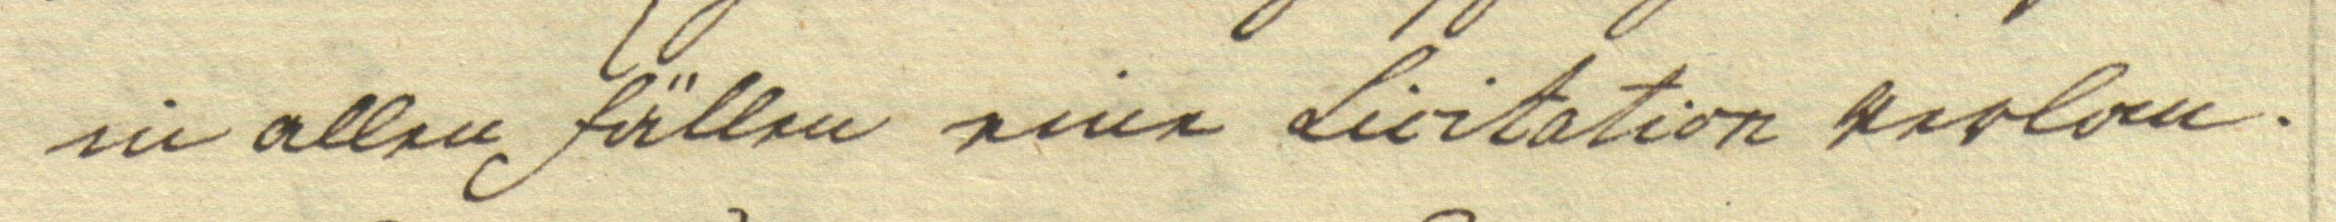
in allen Fällen eine Licitation verlan¬
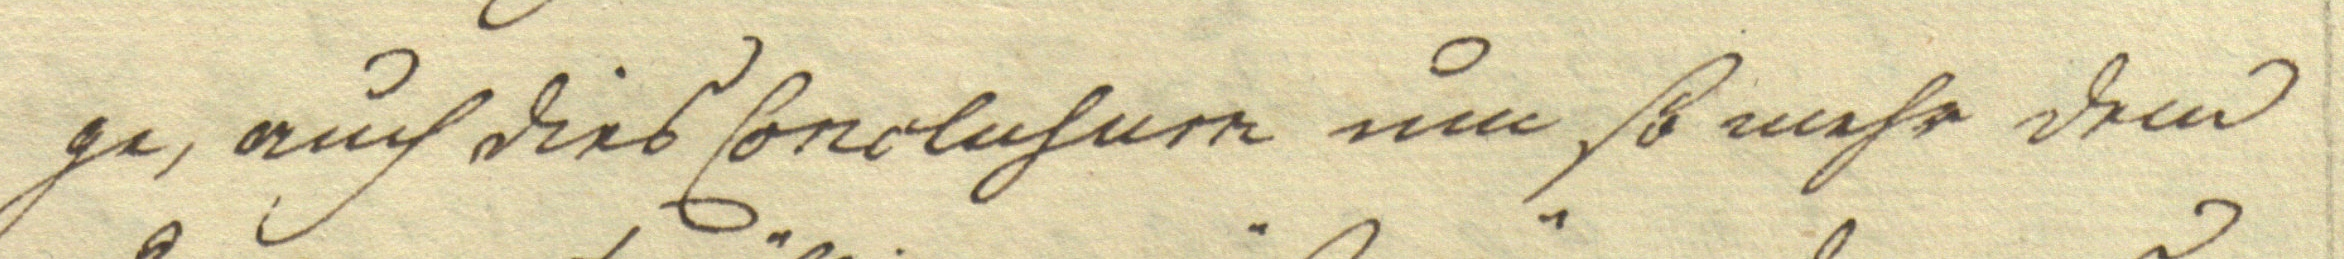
ge, auch dies Conclusum um so mehr dem
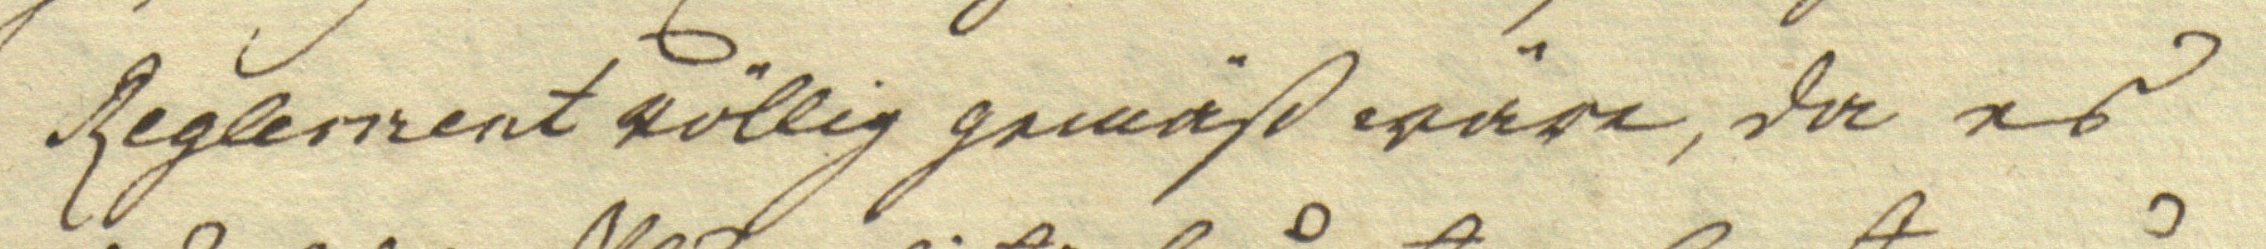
Reglement völlig gemäß wäre, da es
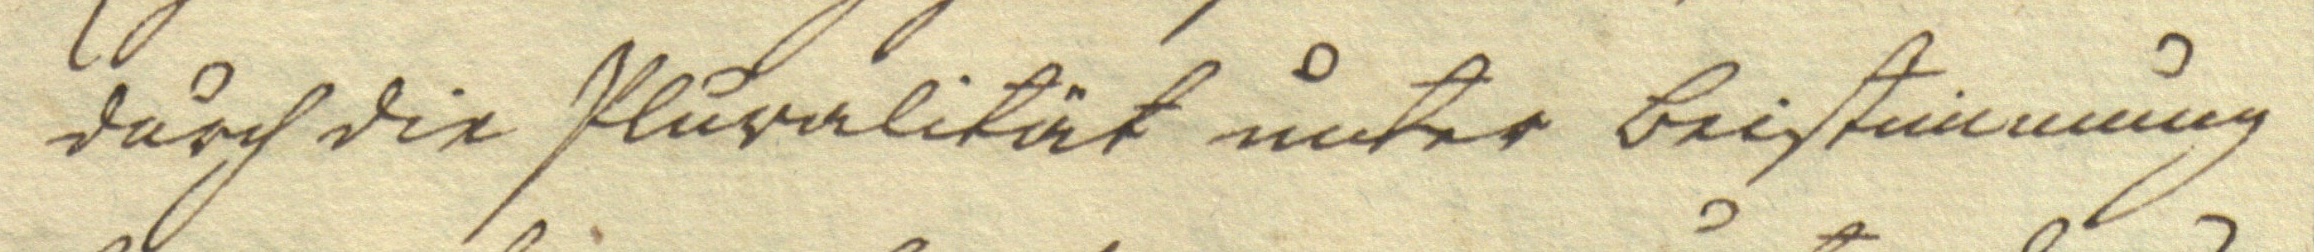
durch die Pluralität unter Beistimmung
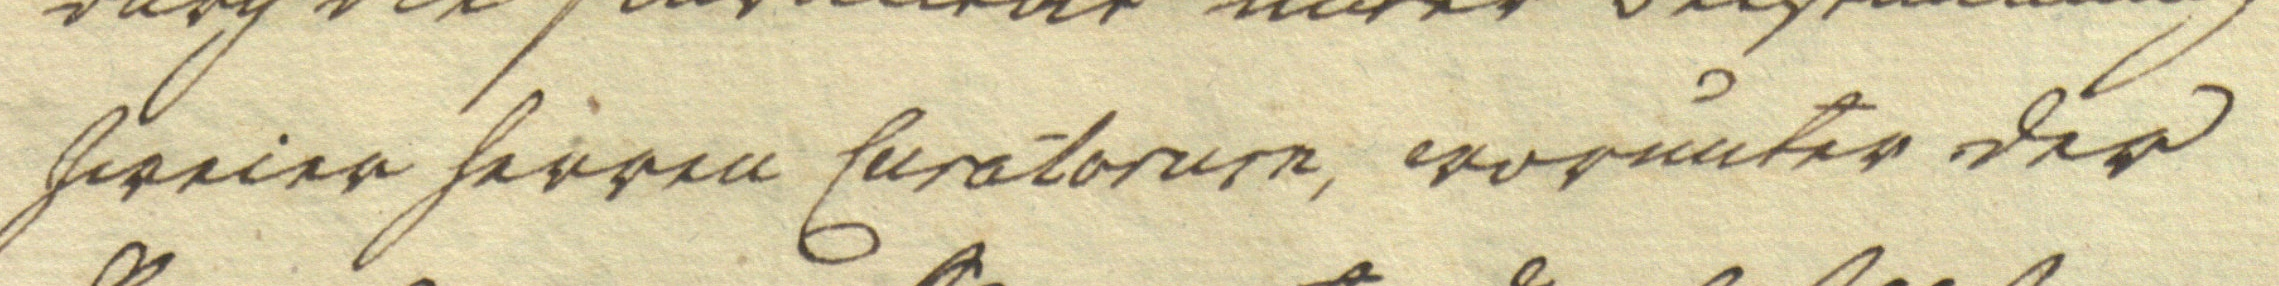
seiner Herren Curatorum, worunter der
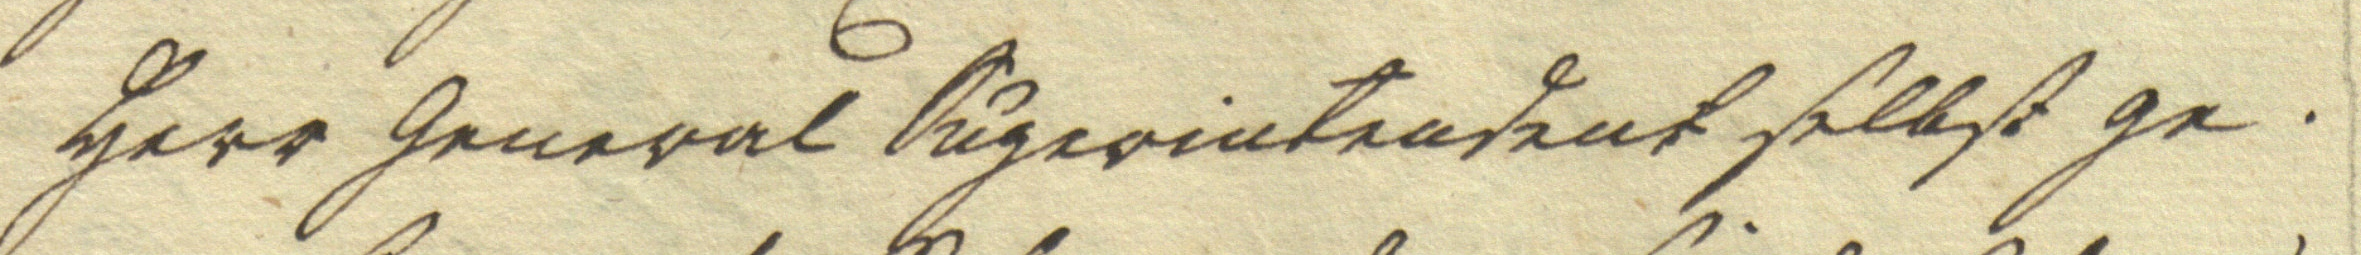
Herr General Superintendent selbst ge¬
